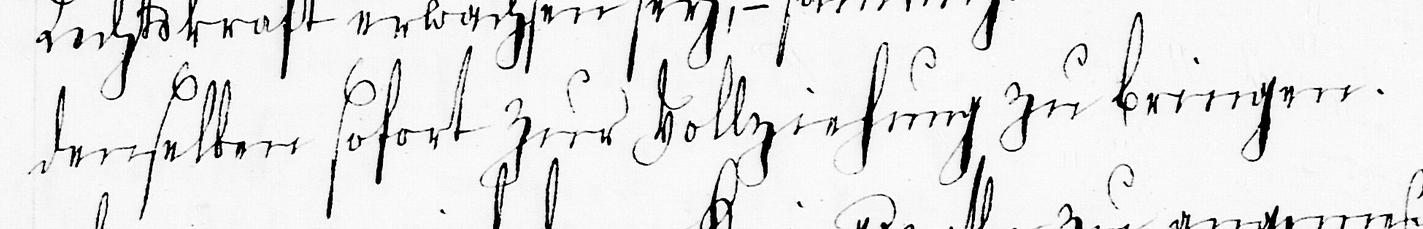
denselben sofort zur Vollziehung zu bringen.
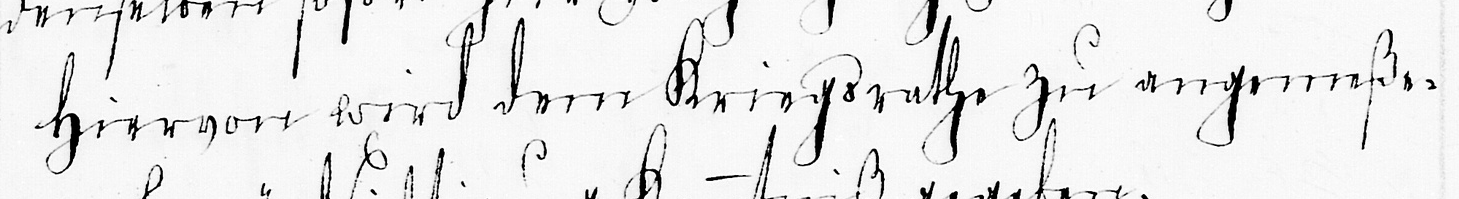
Hiervon wird dem Kriegsrathe zu angemeße¬
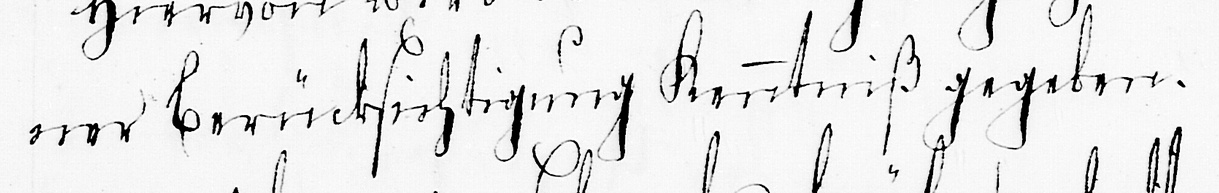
ner Berücksichtigung Kenntniß gegeben.
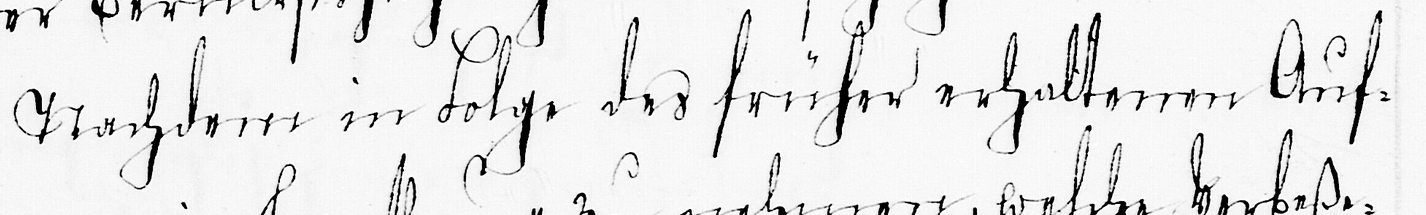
Nachdem in Folge des früher erhaltenen Auf¬
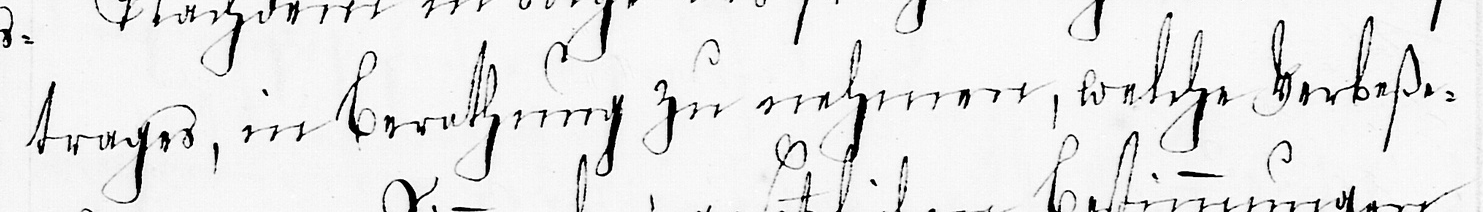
trages, in Berathung zu nehmen, welche Verbeße¬
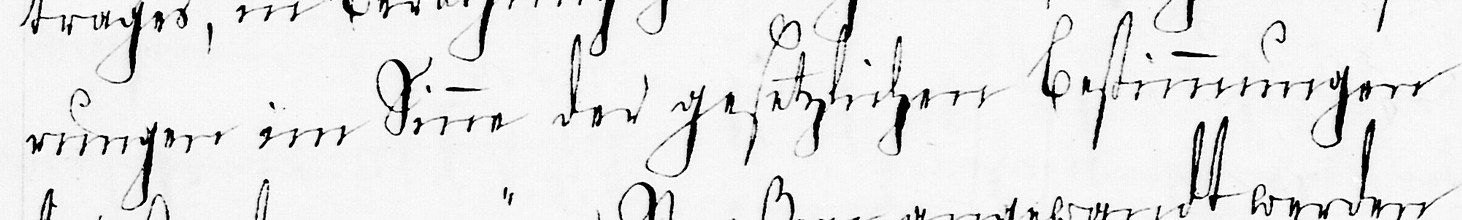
rungen im Sinne der gesetzlichen Bestimmungen
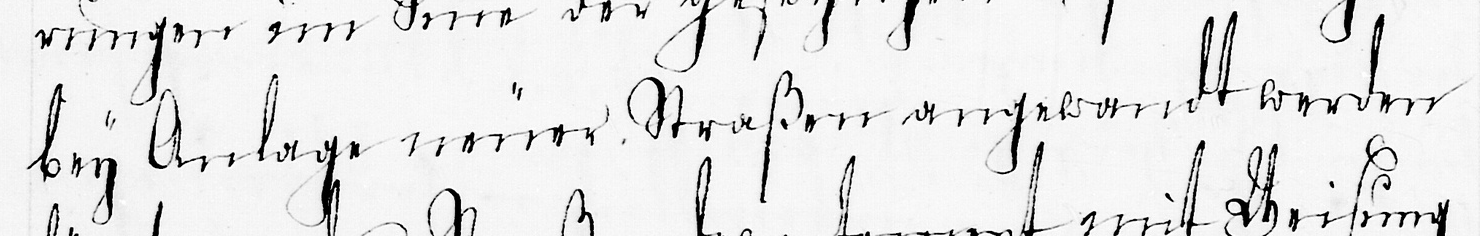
bey Anlage neuer Straßen angewandt werden
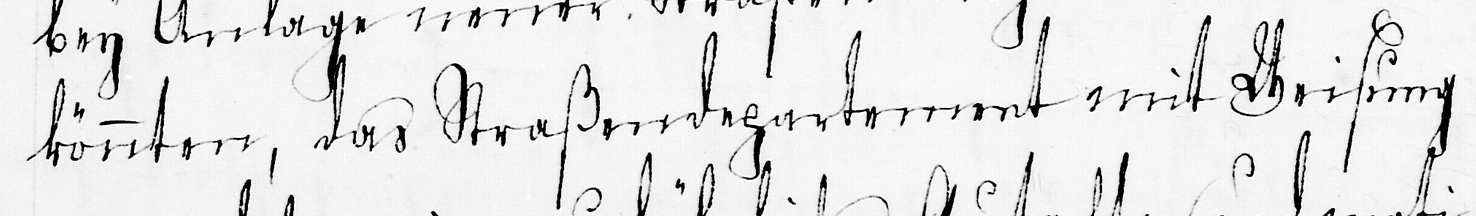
könnten, das Straßendepartement mit Weisung
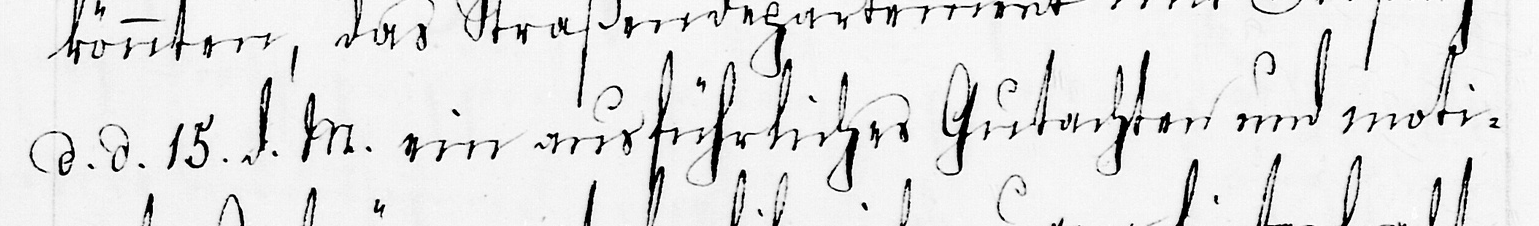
d. d. 15. d. M. ein ausführliches Gutachten und moti¬
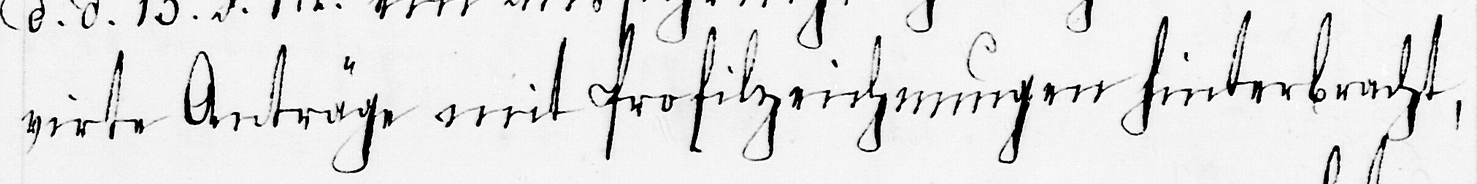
virte Anträge mit Profilzeichnungen hinterbracht,
